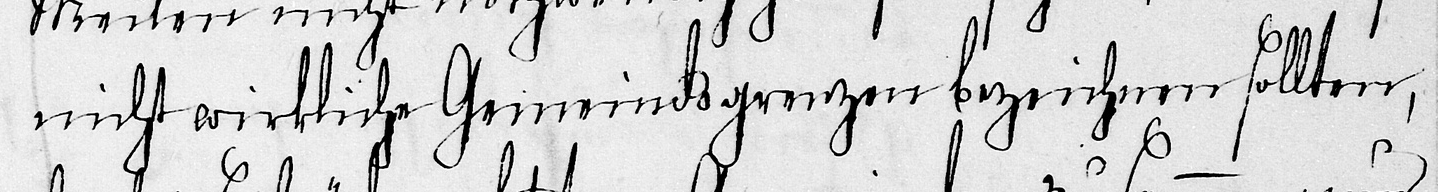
nicht wirkliche Gemeindsgrenzen bezeichnen sollten,
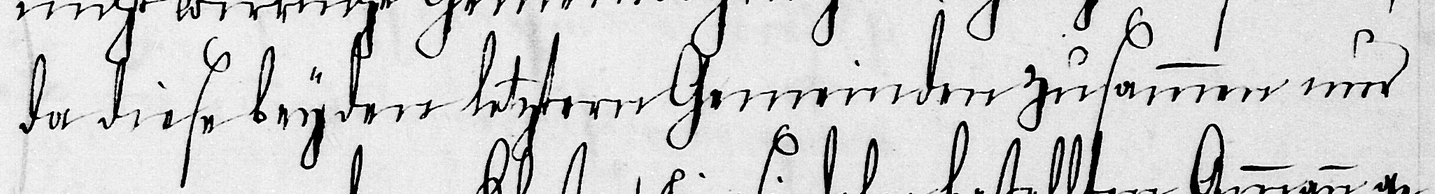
da diese beyden letztern Gemeinden zusammen nur
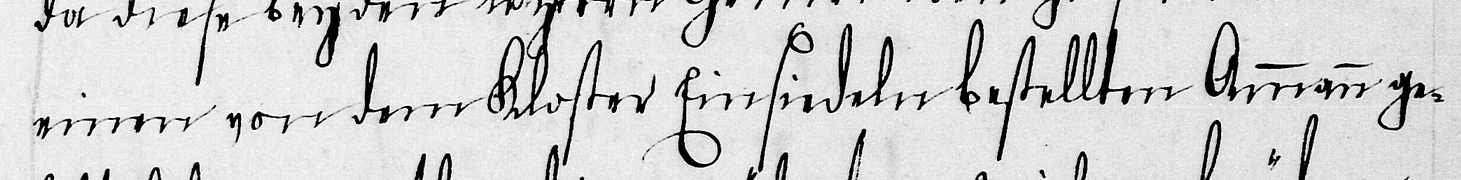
einen von dem Kloster Einsiedeln bestellten Ammann ge¬
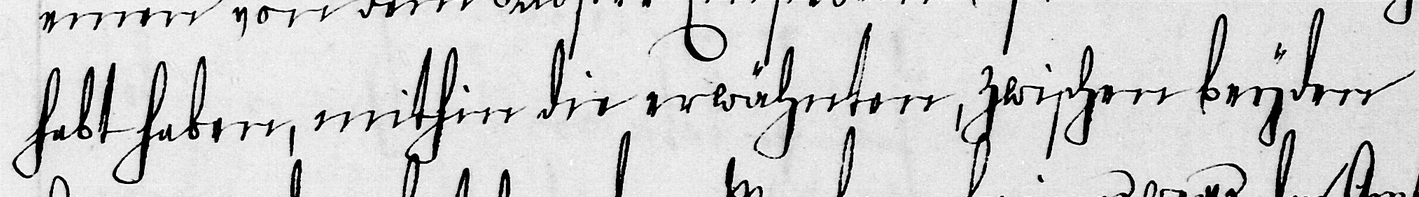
habt haben, mithin die erwähnten, zwischen beyden
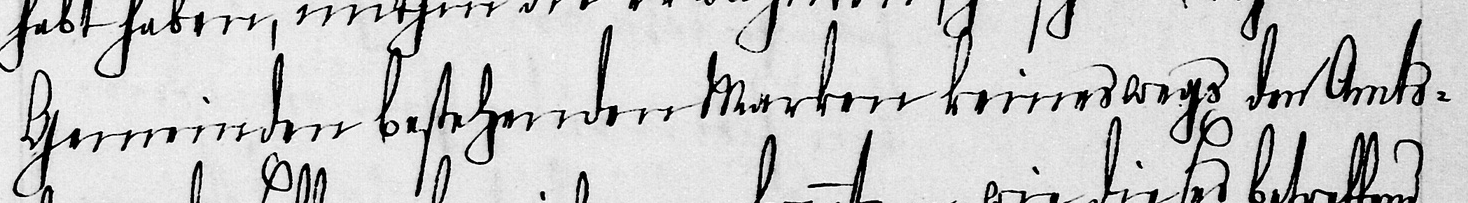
Gemeinden bestehenden Marken keineswegs den Amts¬
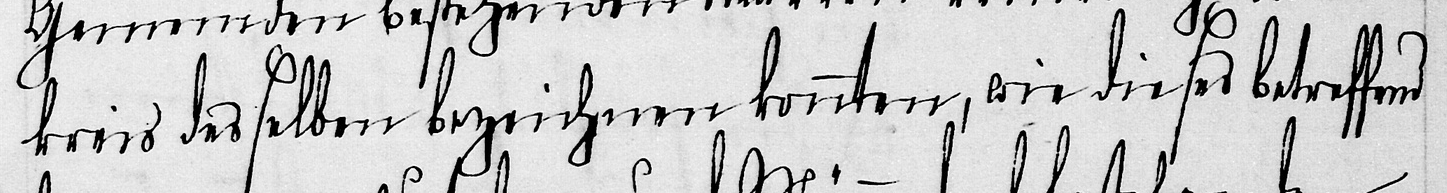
kreis desselben bezeichnen konnten, wie dieses betreffe¬
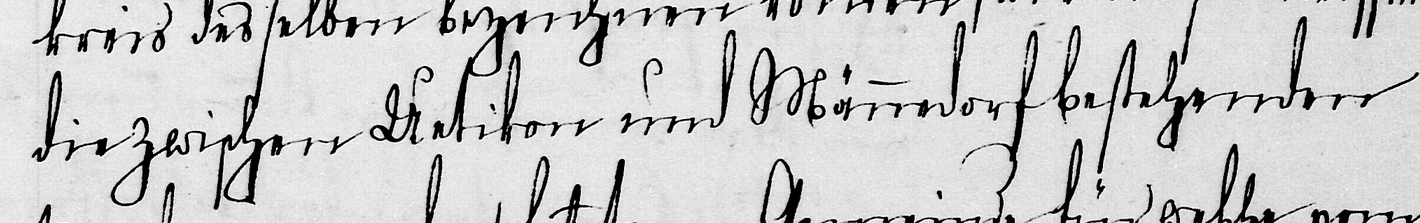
die zwischen Uetikon und Männedorf bestehenden
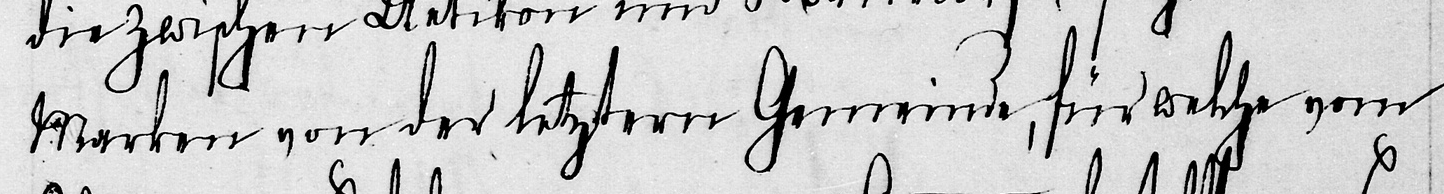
Marken von der letztern Gemeinde, für welche vom
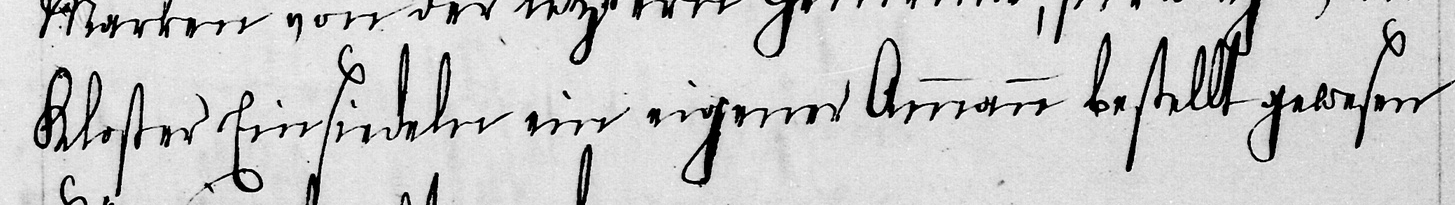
Kloster Einsiedeln ein eigener Ammann bestellt gewesen
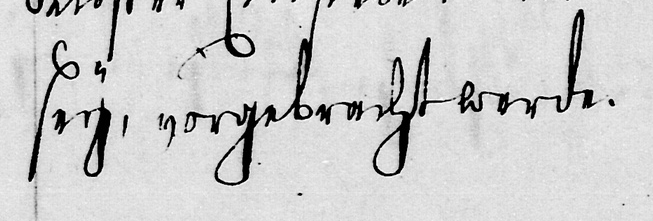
sey, vorgebracht werde.
